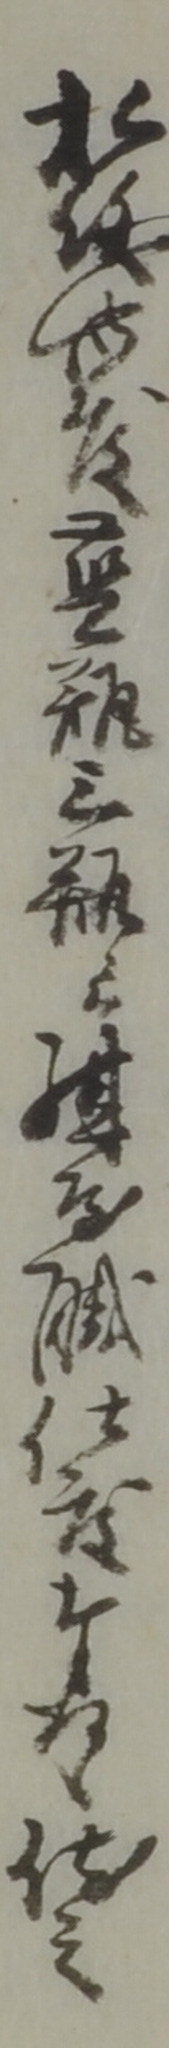私儀此度藍瓶三瓶ニ而紺屋職仕度奉存候依之
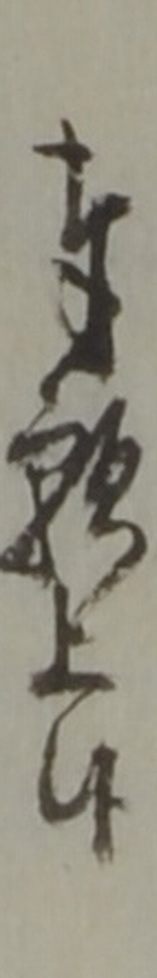奉願上候
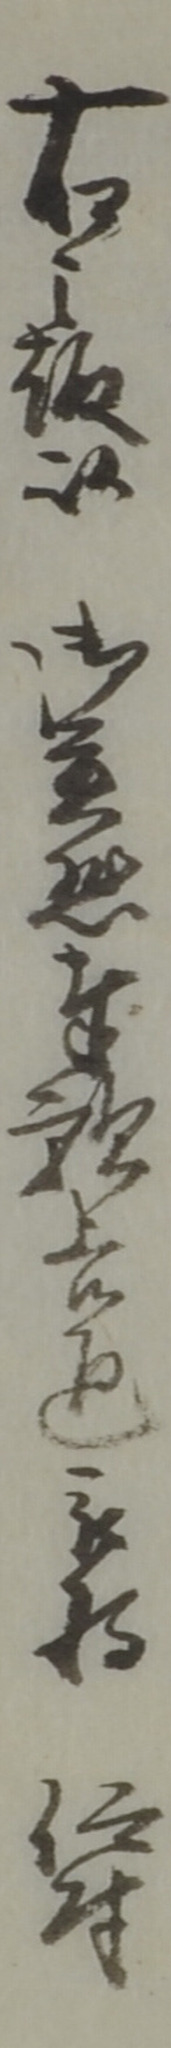右之趣以御慈悲奉願上候通被為仰付
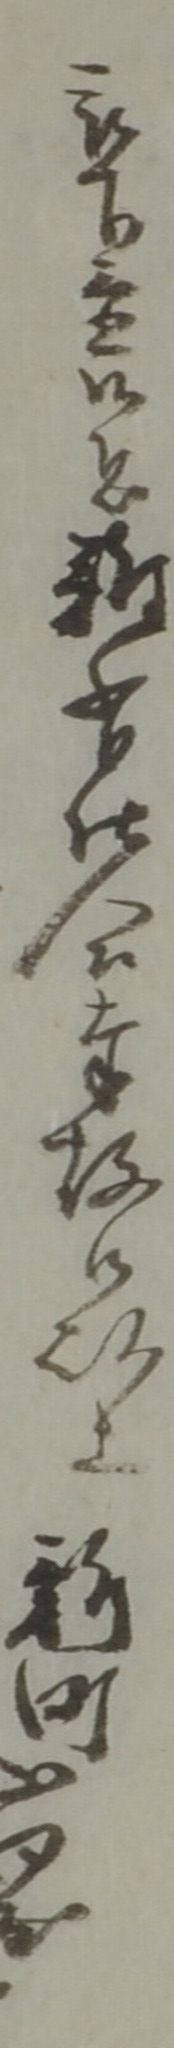被下置候者難有仕合奉存候以上新町山田屋
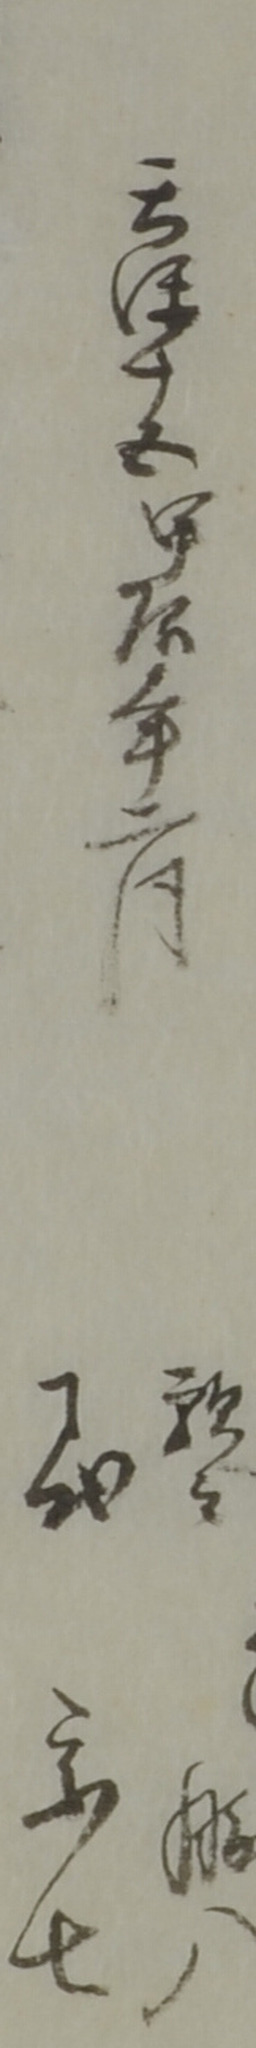天保十五甲辰年二月願主甚蔵
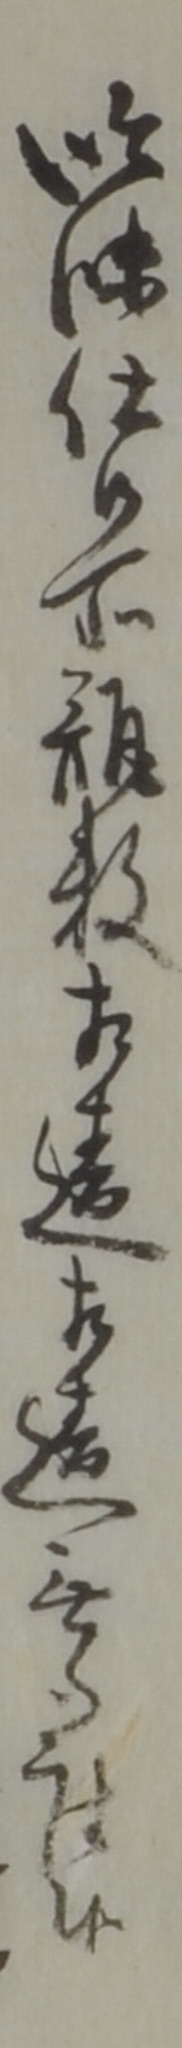吟味仕候所瓶数相違相違無御座候
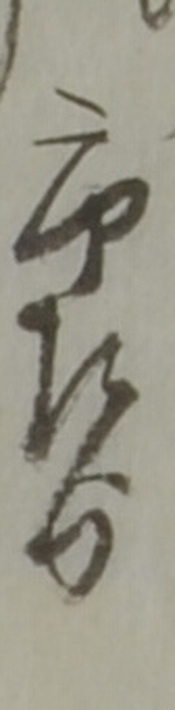市左衛門
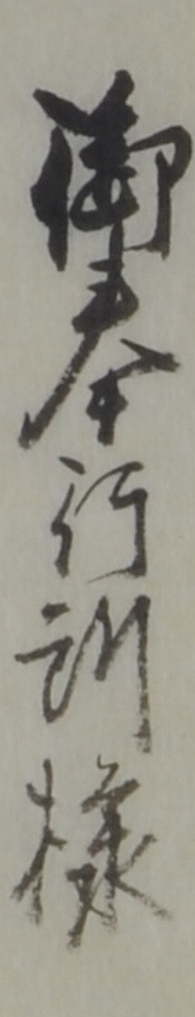御奉行所様
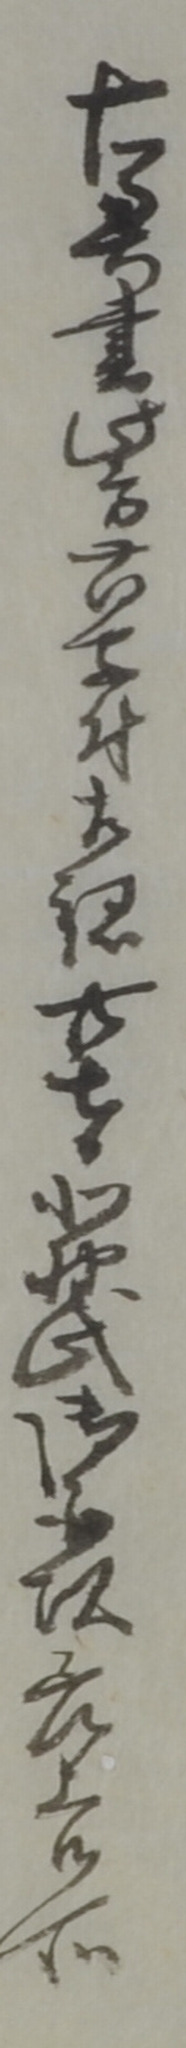右奥書此方苗字付相認廿七日北野氏御取次差上候所

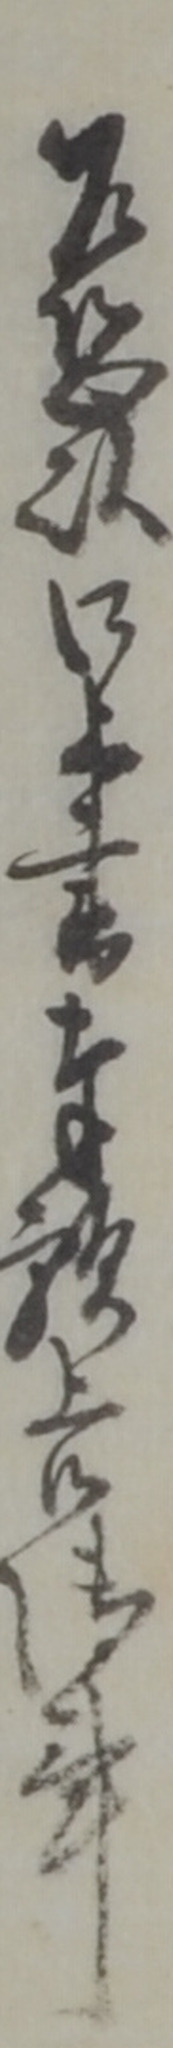乍恐以口上書奉願上候御事
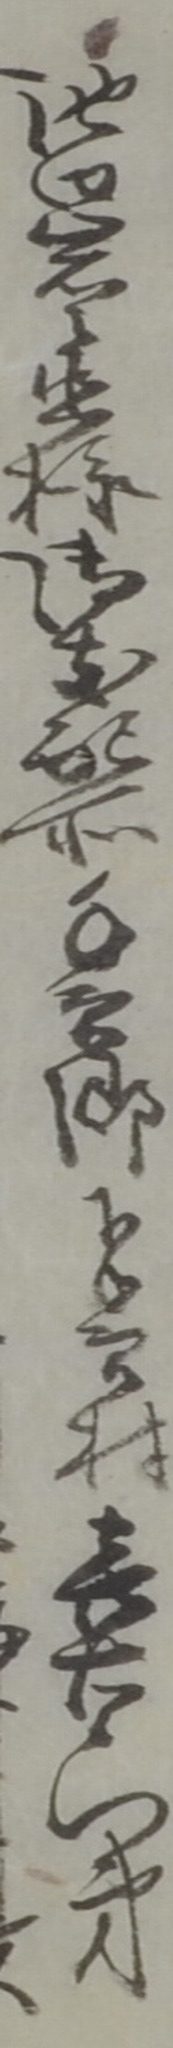池田岩之丞様御支配所手良郷下手良村喜右衛門弟
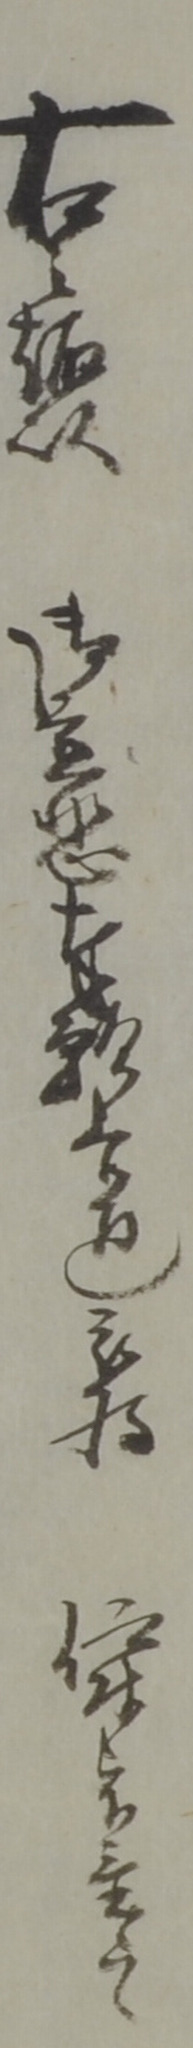右之趣以御慈悲奉願上候通町被為仰付被下置候ハヽ
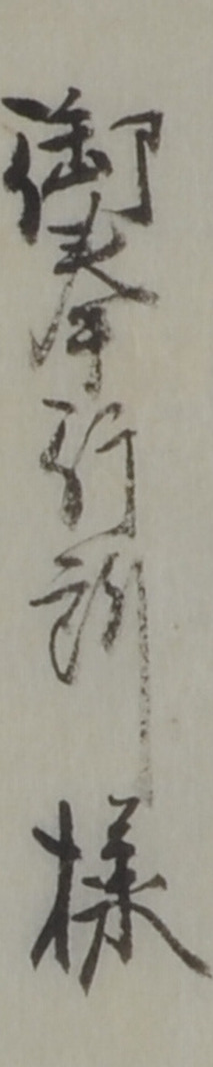御奉行所様
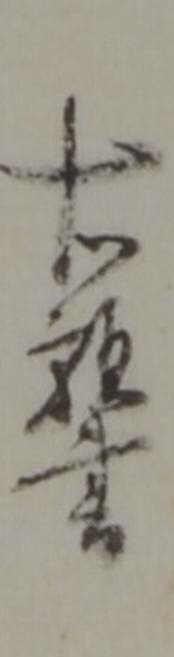右願書
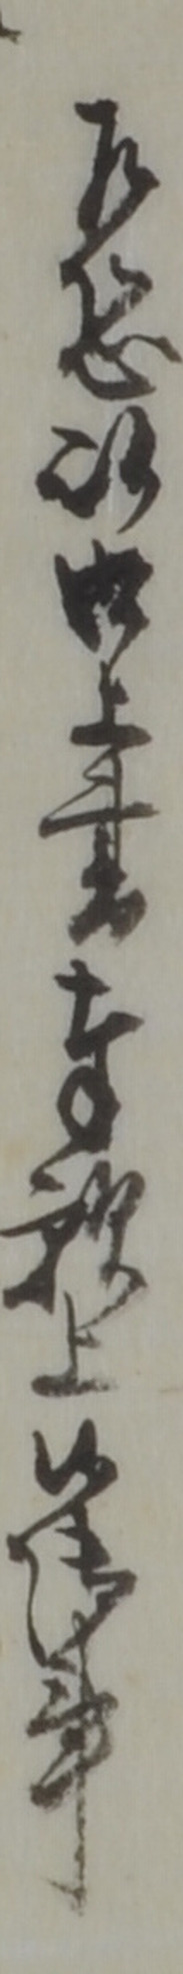乍恐以口上書奉願上候御事
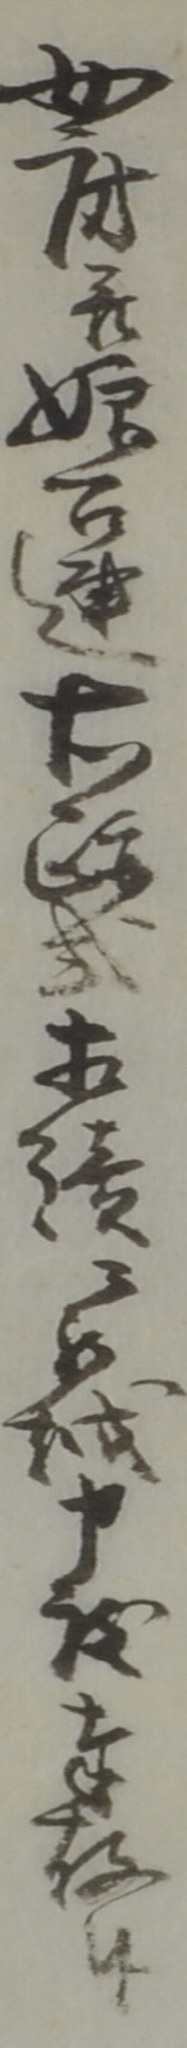女房幷娘召連右跡式相続ニ罷越申度奉存候
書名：諸願書控簿
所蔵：伊那市立高遠町図書館・合同会社AMANE
